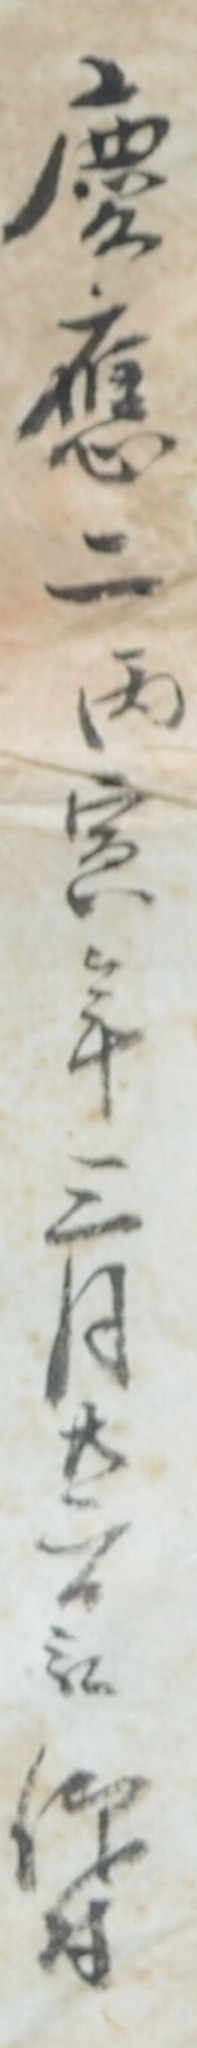慶応二丙寅年三月廿二日被仰付
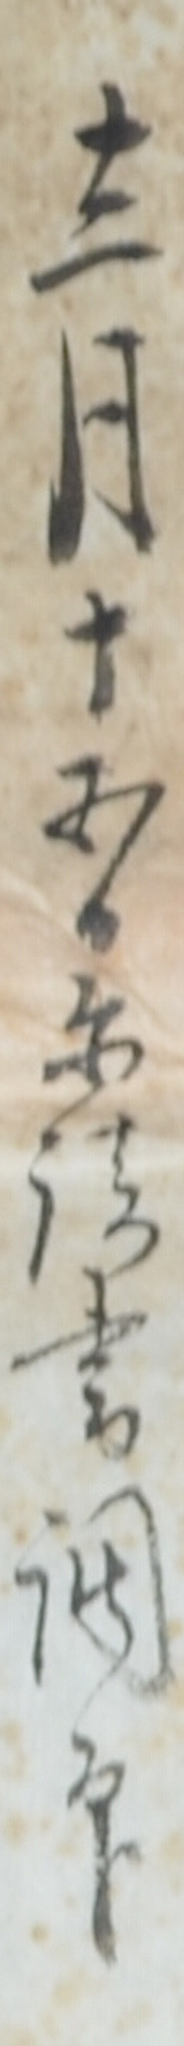十二月十五日示談書調印
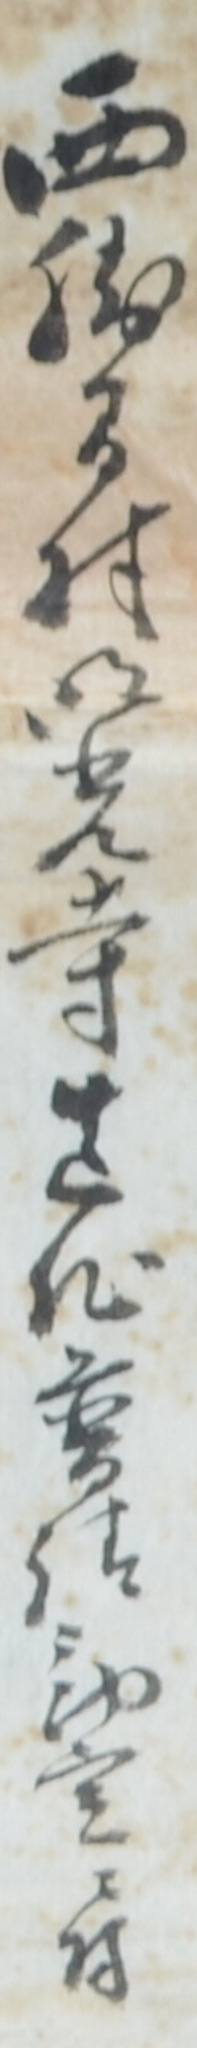西勝間村明光寺造作普請勘定ニ付
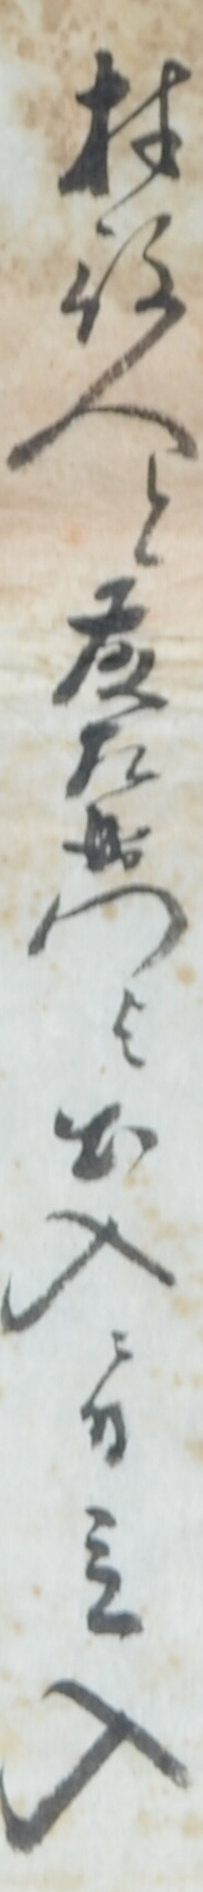村役人と藤左衛門と出入ニ付立入
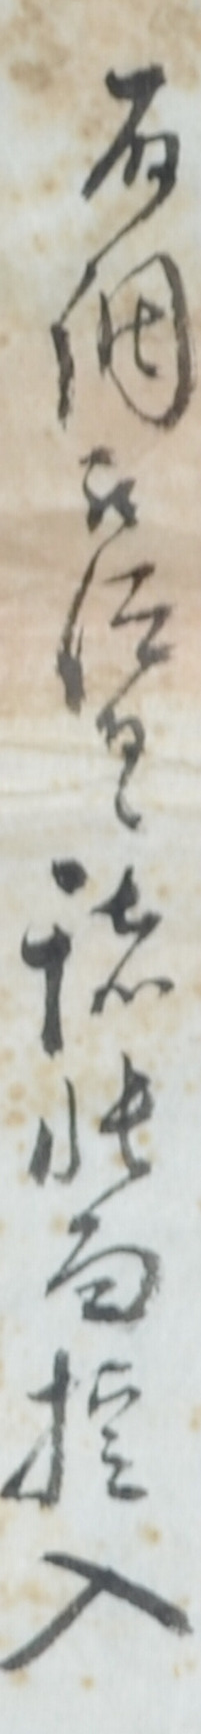取調被仰付候諸帳面控入
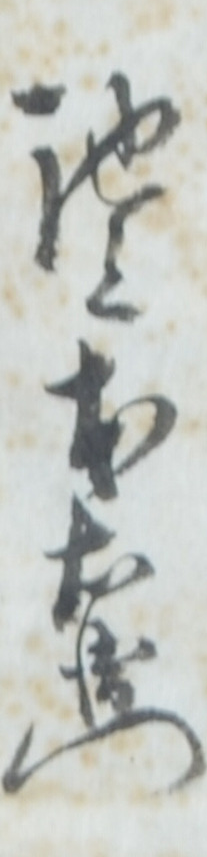池上本右衛門
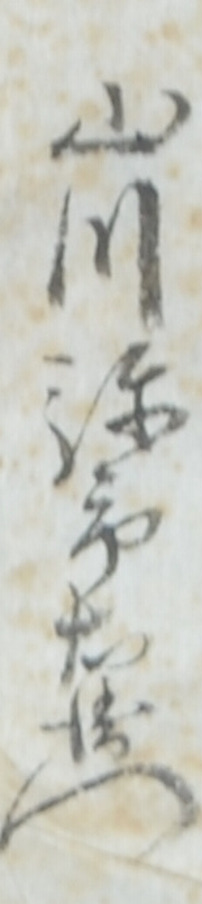山川弥市右衛門
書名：（西勝間村出入一件資料状袋）
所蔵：伊那市立高遠町図書館・合同会社AMANE
